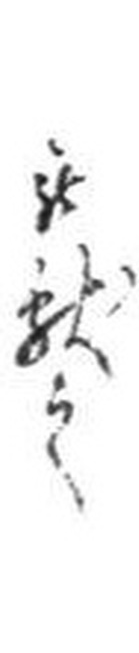被献之
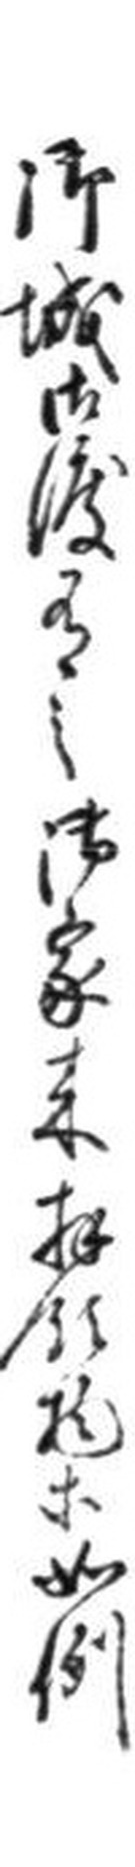御城御渡有之御家来拝領物等如例
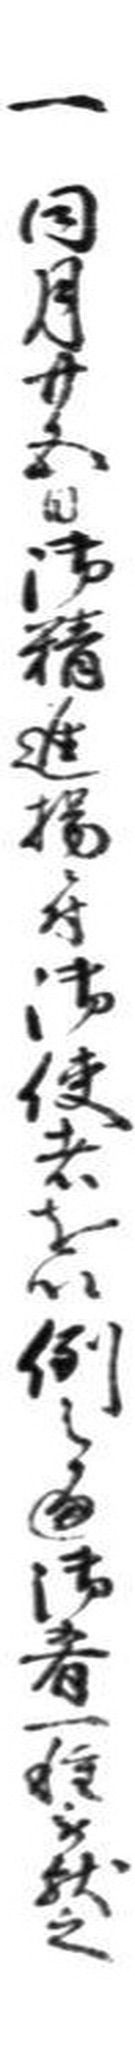一同月廿五日御精進揚ニ付御使者を以例之通御肴一種被献之
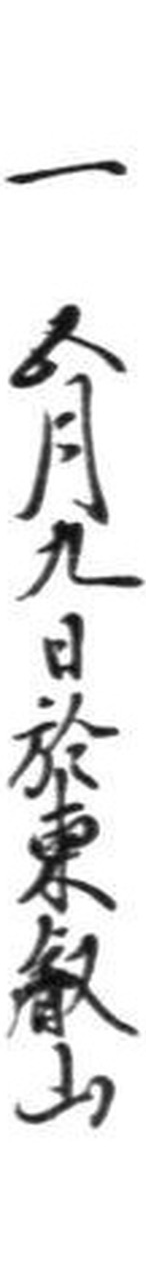一五月九日於東叡山
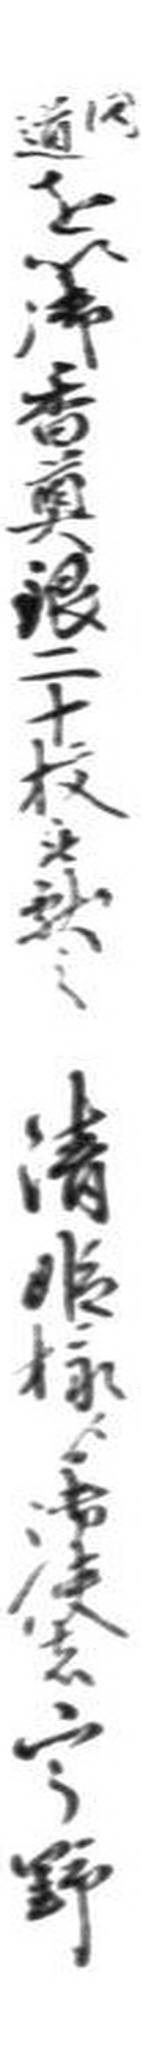同道を以御香奠銀二十枚被献之清姫様ゟ御使者宇野
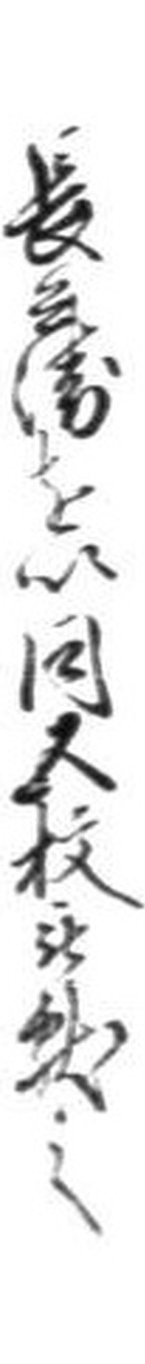長兵衛を以同五枚被献之
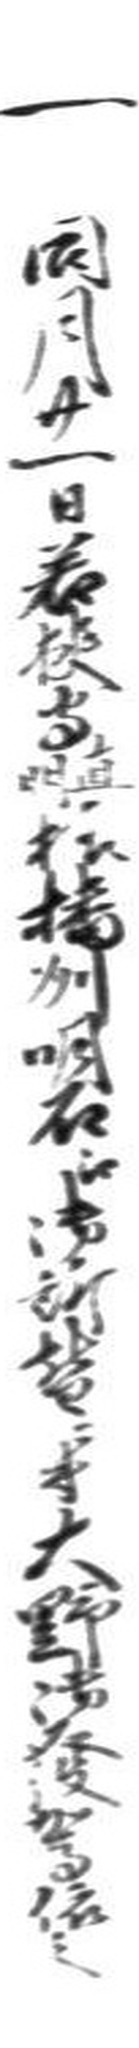一同月廿一日若狭守直明様播州明石江御所替ニ付大野御発駕依之
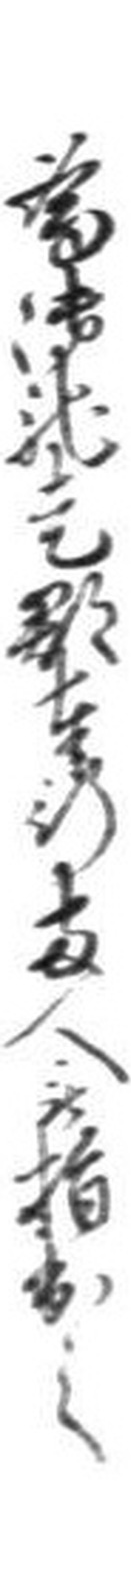為御馳走郡奉行両人被指出之
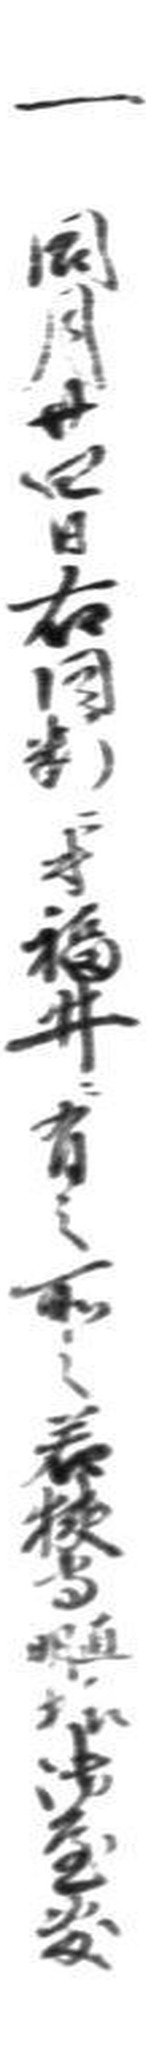一同月廿四日右同断ニ付福井ニ有之所之若狭守直明様御屋敷
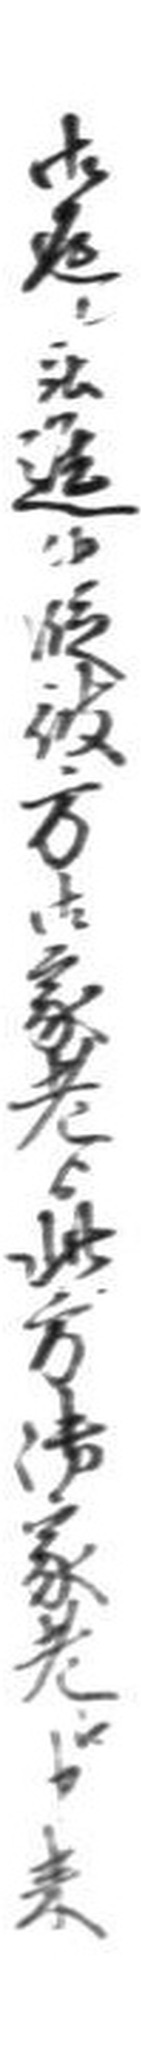御返シ被進候段彼方御家老ゟ此方御家老江申来
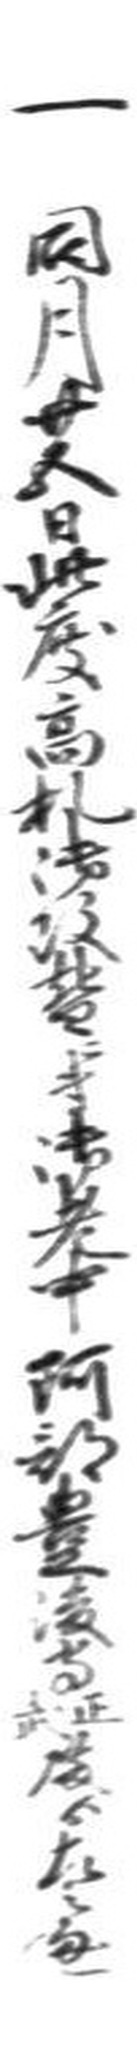一同月廿五日此度高札御改替ニ付御老中阿部豊後守正武殿ゟ左之通

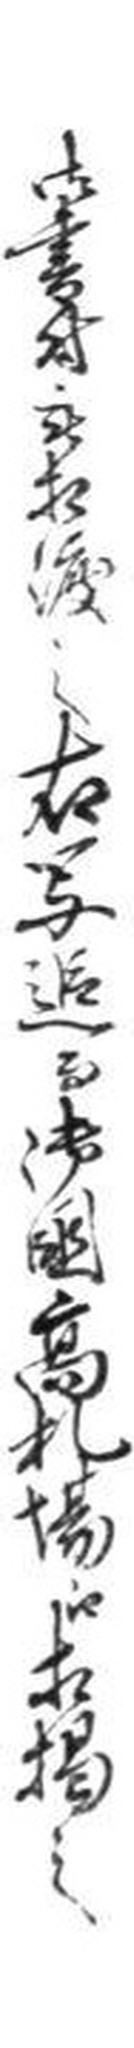御書付被相渡之右写追而御国高札場江相掲之
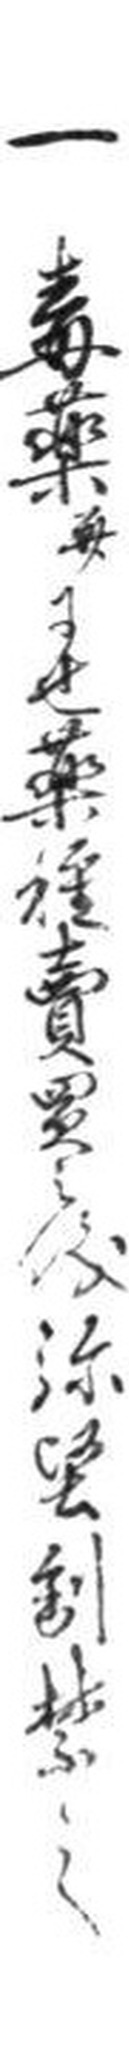一毒薬并にせ薬種売買之儀弥堅制禁之
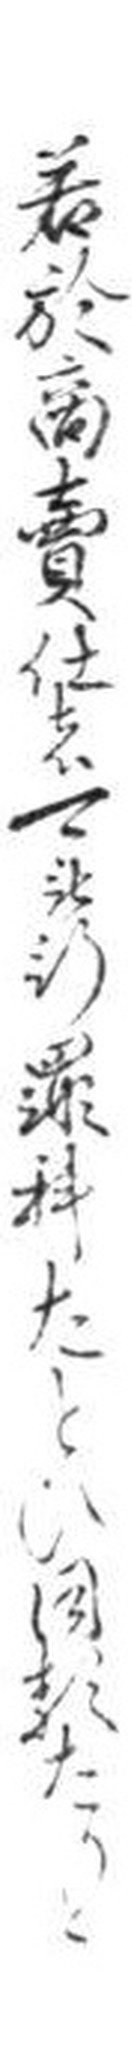若於商売仕者可被行罪科たとひ同類たりと
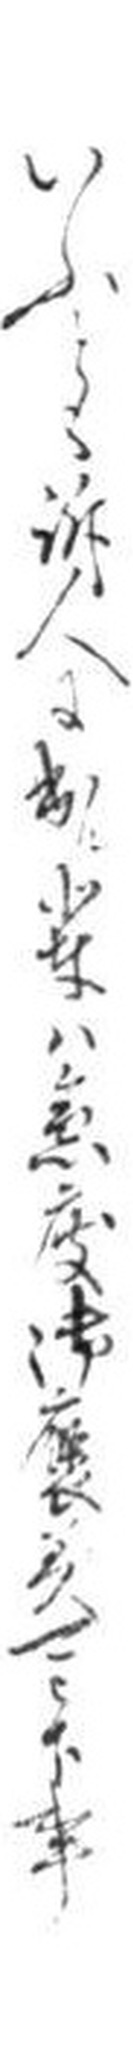いふとも訴人に出ル輩ハ急度御褒美可被下事
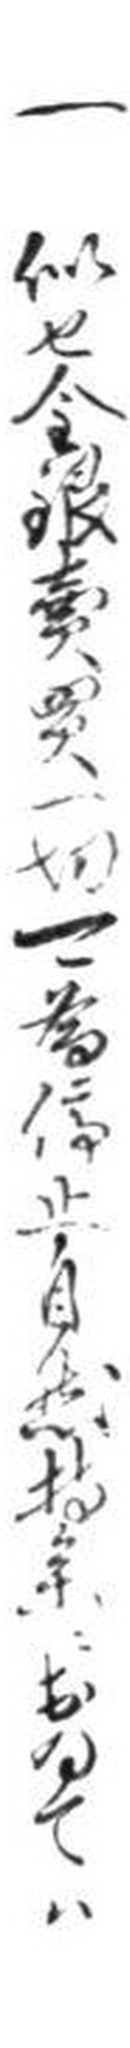一似せ金銀売買一切可為停止自然持参ニおゐてハ
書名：家譜 十五 綱昌公 従天和元年到元禄十二年
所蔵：福井県文書館 Fukui Prefectural Archives
